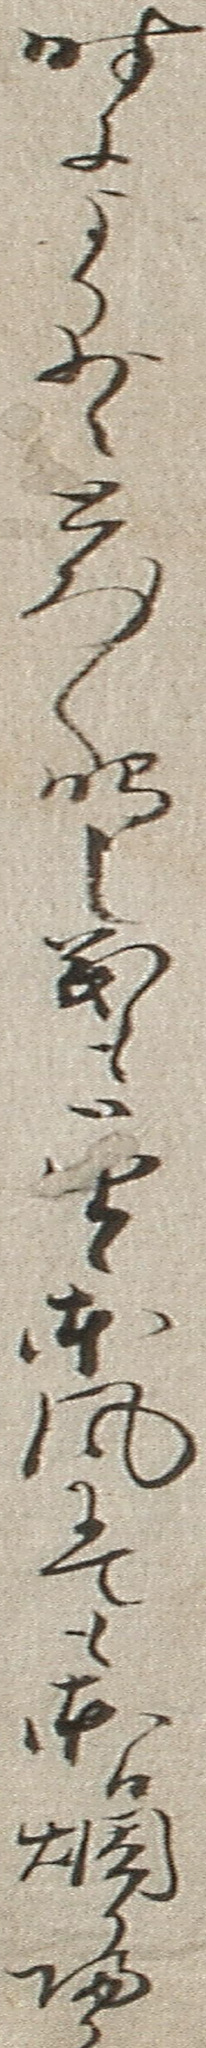時により少々とろ〳〵鳴申候義も御座候東風に而も東江烟り帰り
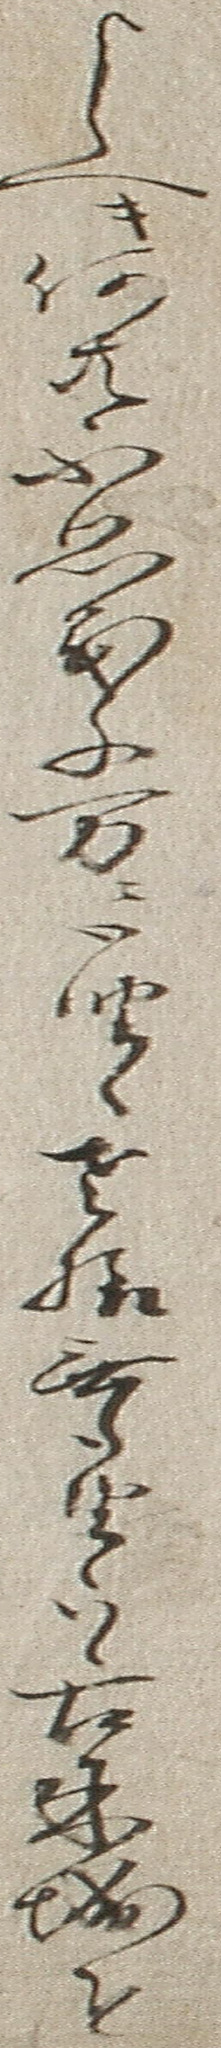申へき何共不思義千万に御座候左様無御座候ハゝ古来城を
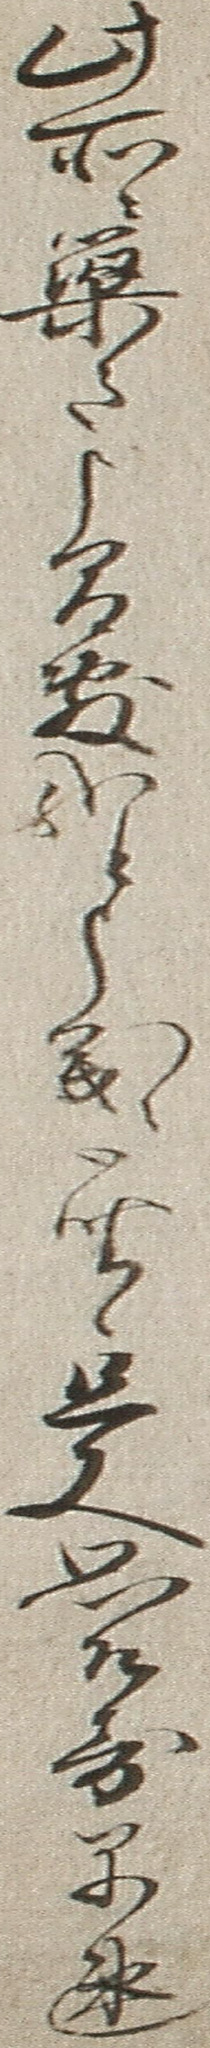此所に築き申間敷哉に申義に御座候且又思召寄早速
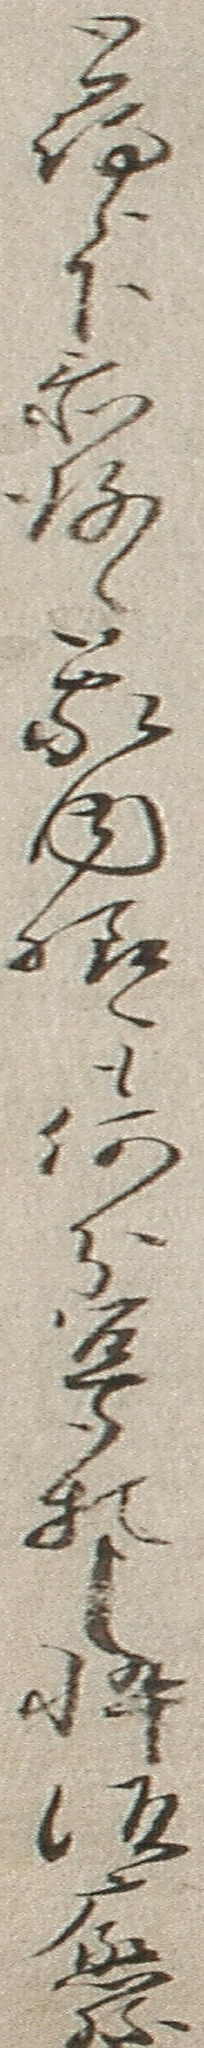御尋被下忝存候御家内様へも何分宜御頼申候忰須摩丞抔

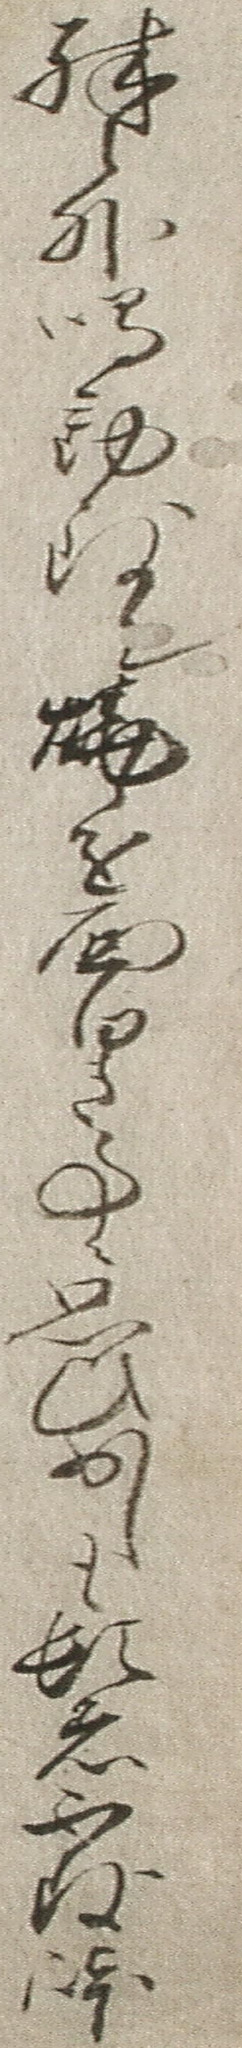殊之外鳴動致し焼を面白き事に思ひ少しも頓着不致峠
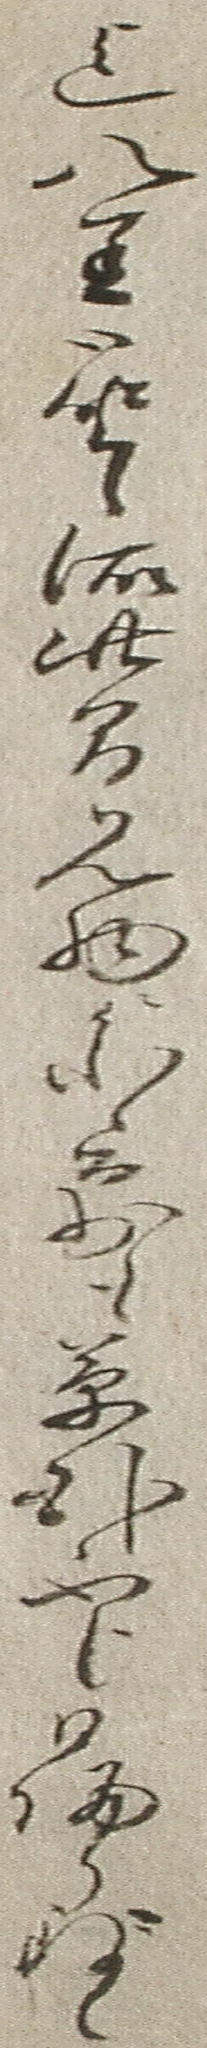迄八里御座候所此間見物に参候而少も草臥不申候日帰り致候
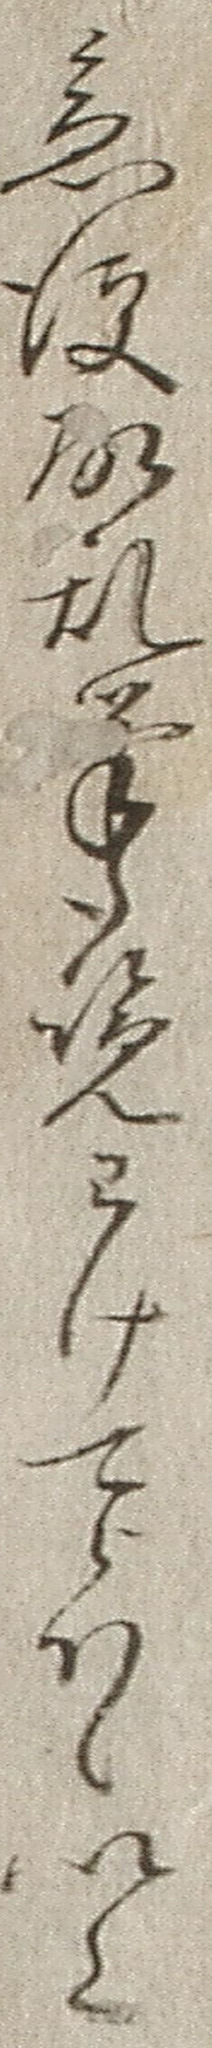急便故乱筆御覧わけて可被下候以上
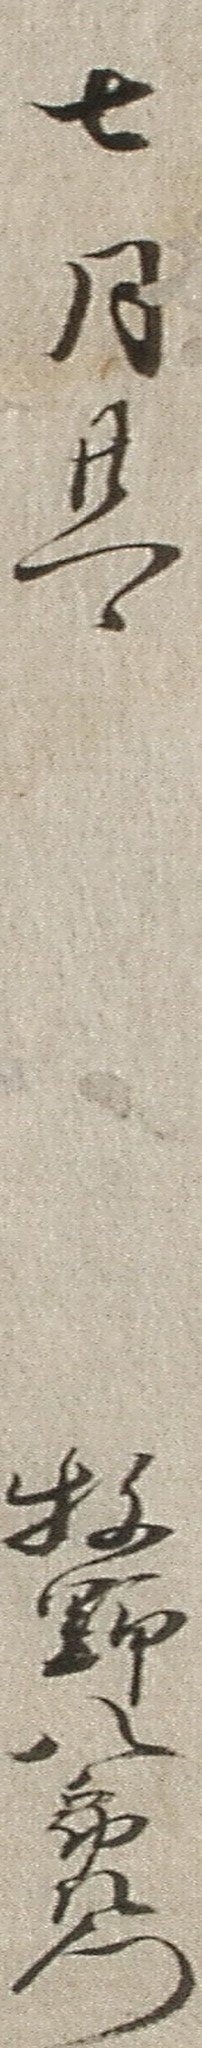七月廿一日牧野八郎左衛門
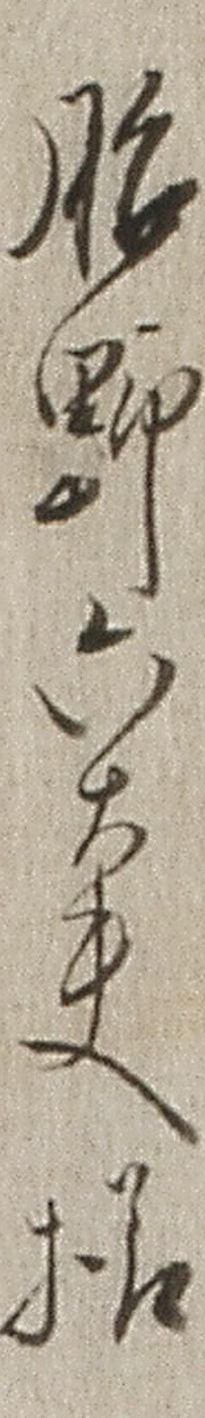胎野六太夫様
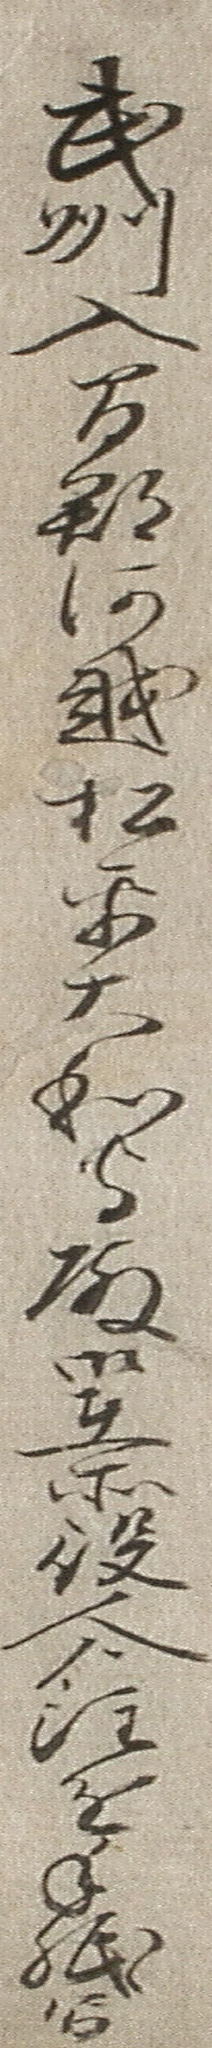武州入間郡河越松平大和守殿御在所役人ゟ注進手紙写
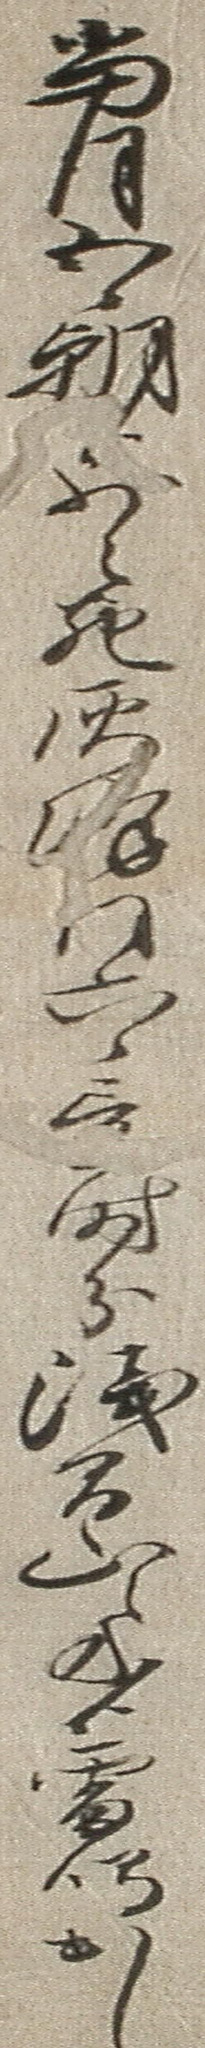当月五日朝ゟ少々宛灰降同六日昼時分浅間山之方ゟ雷鳴出し
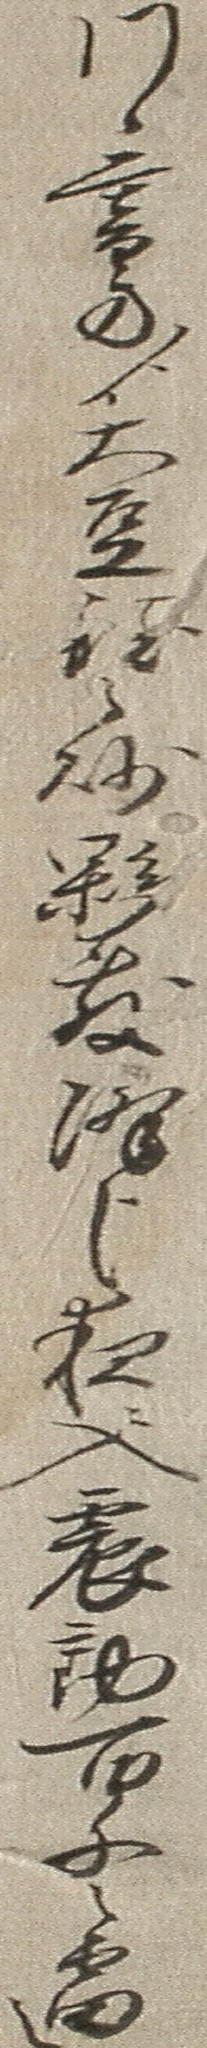同日暮方ゟ大豆程之砂夥敷降申候夜に入震動百千の雷之
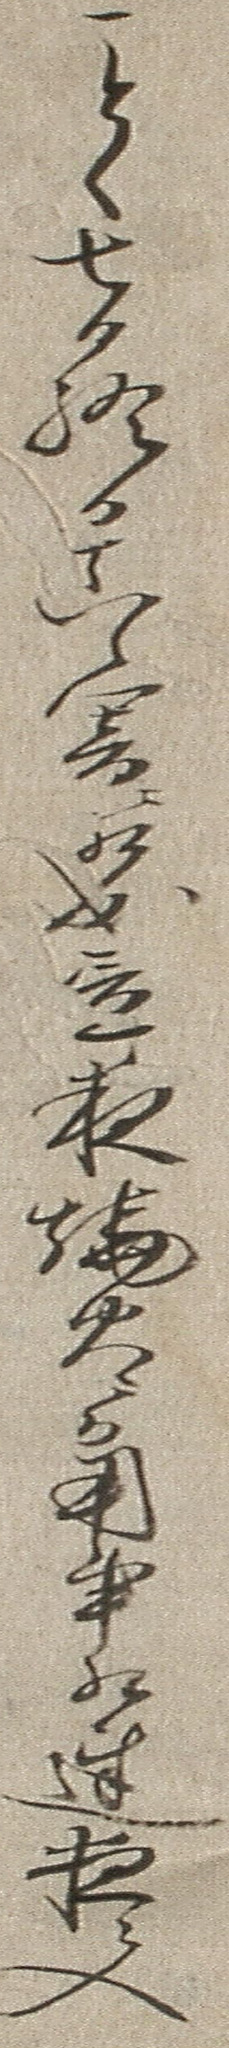ことく七日終日真闇に相成昼夜焼火に而用事相遅夜に入
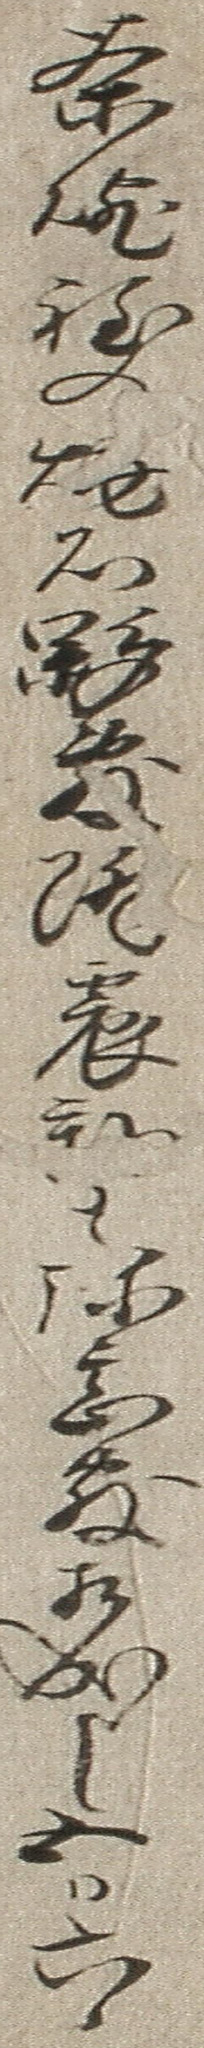茶碗程の焼石夥敷く降震動も弥甚敷相成申候五日六日
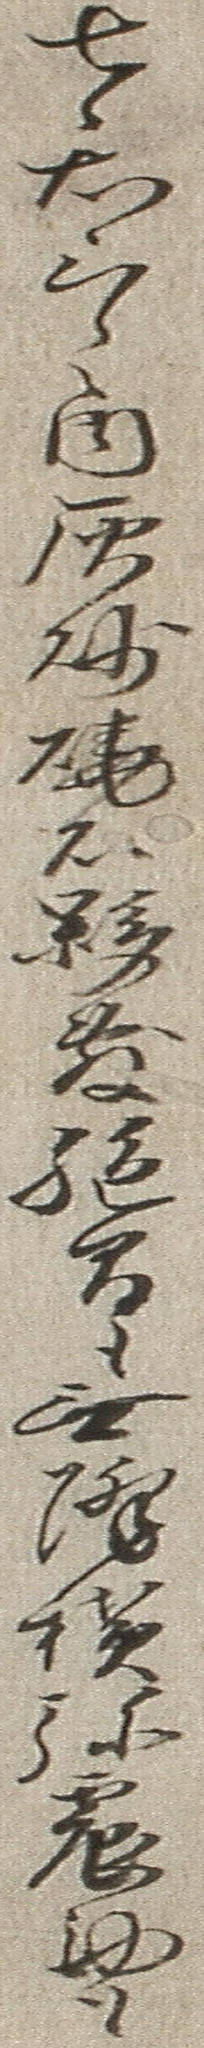七日右三日之内灰砂焼石夥敷絶間も無降積弥震動も
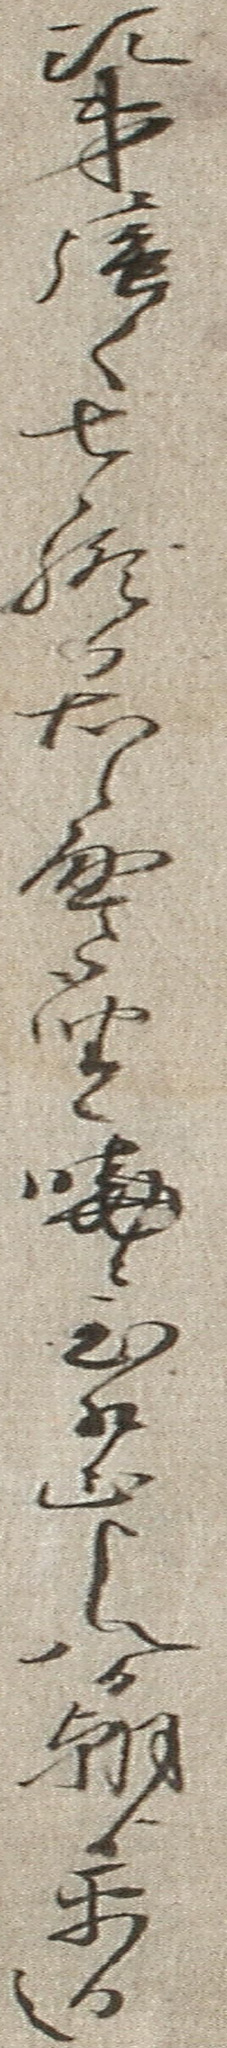次第に強く七日終日右之通御座候暁に至相止申候八日朝ゟ平日之
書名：太平秘録抜書　浅間山燒及普賢山崩
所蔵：東京大学地震研究所図書室 Earthquake Research Institute Library, The University of Tokyo, JAPAN
